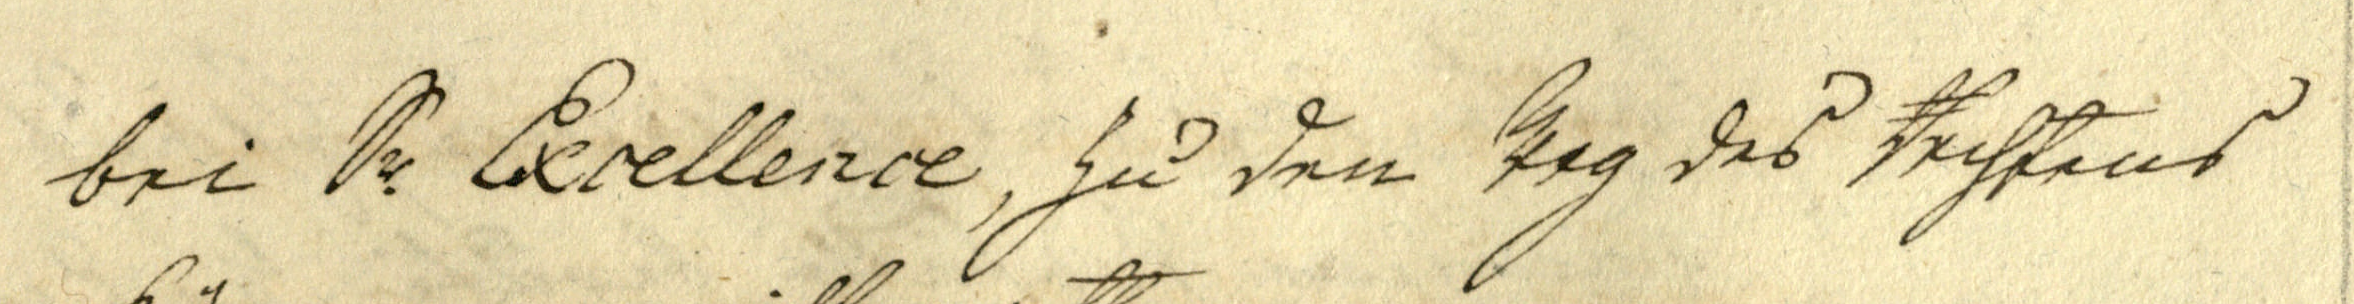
bei Sr Excellence, zu den Weg des Rechtens
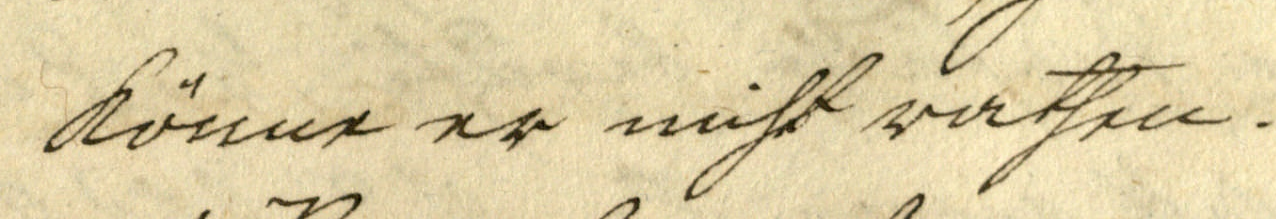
könne er nicht rathen.
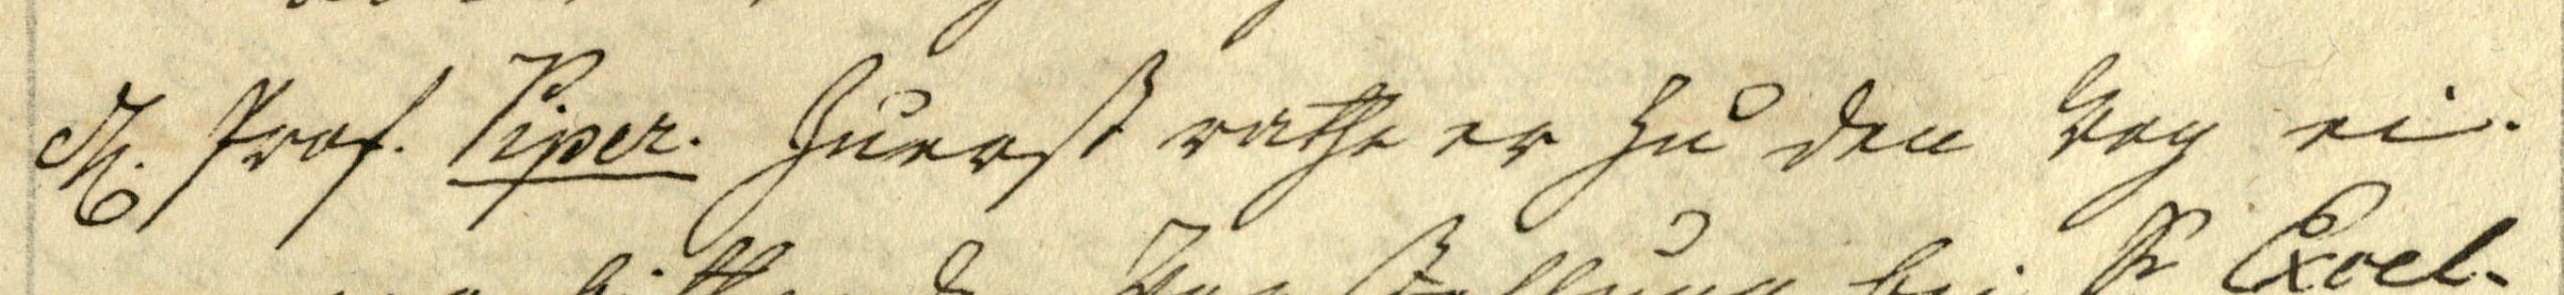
dh. Prof. Piper. Zuerst rathe er zu den Weg ei¬
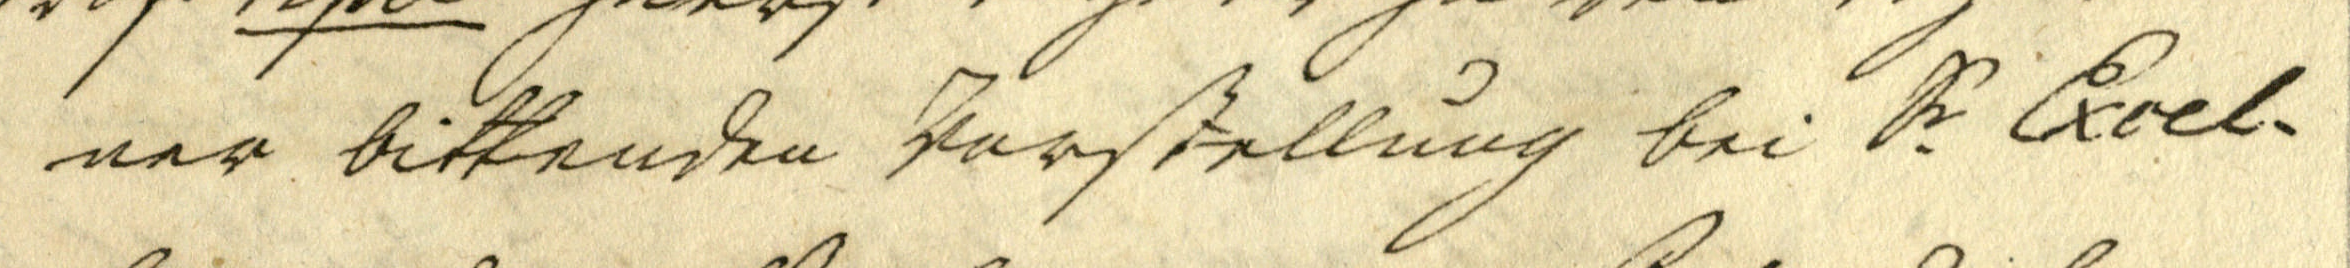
ner bittenden Vorstellung bei Sr Excel¬
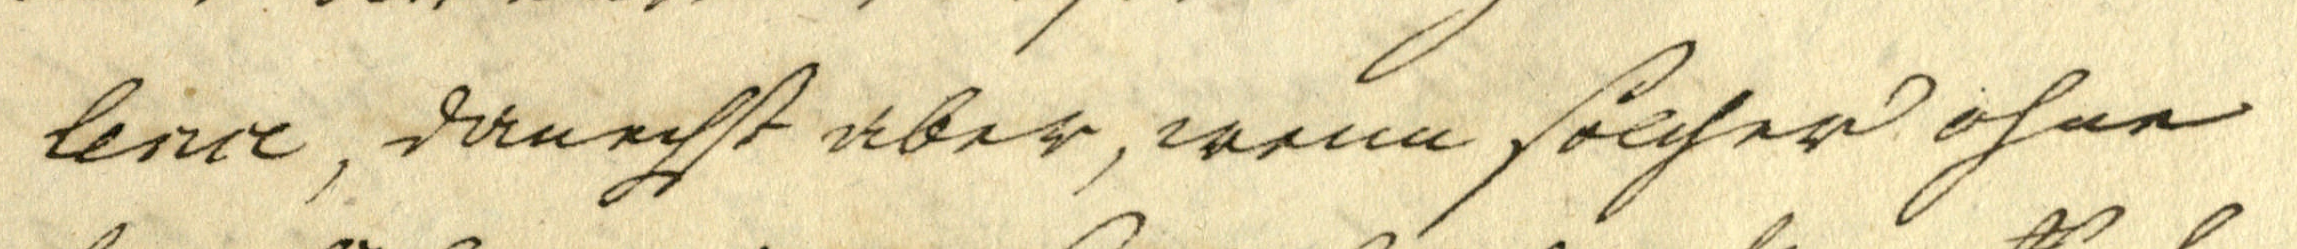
lence, danechst aber, wenn solcher ohne
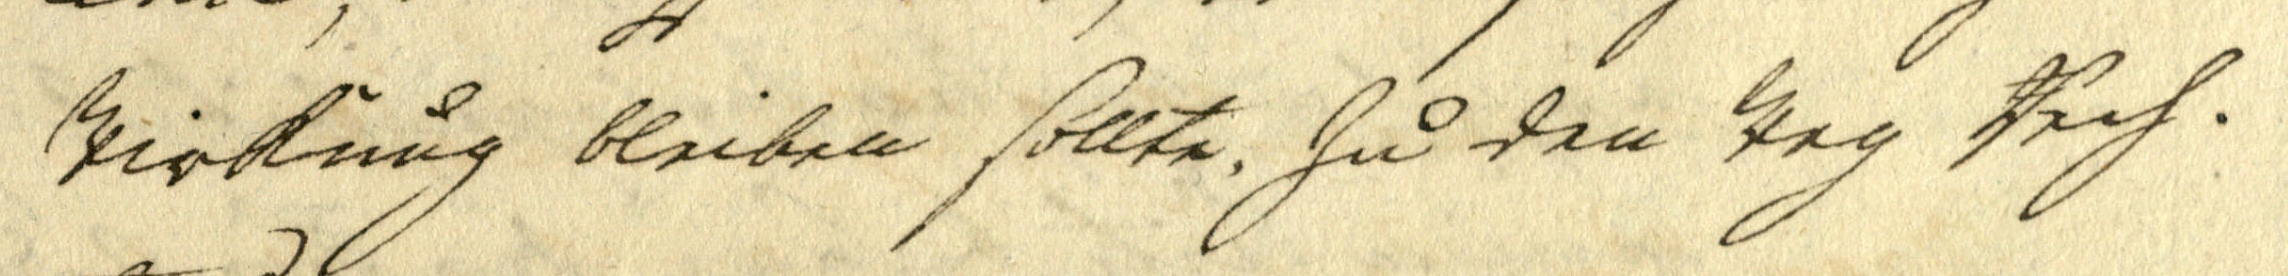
Wirkung bleiben sollte, zu den Weg Rech¬
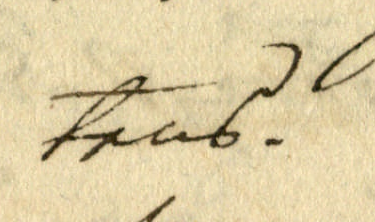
tens.
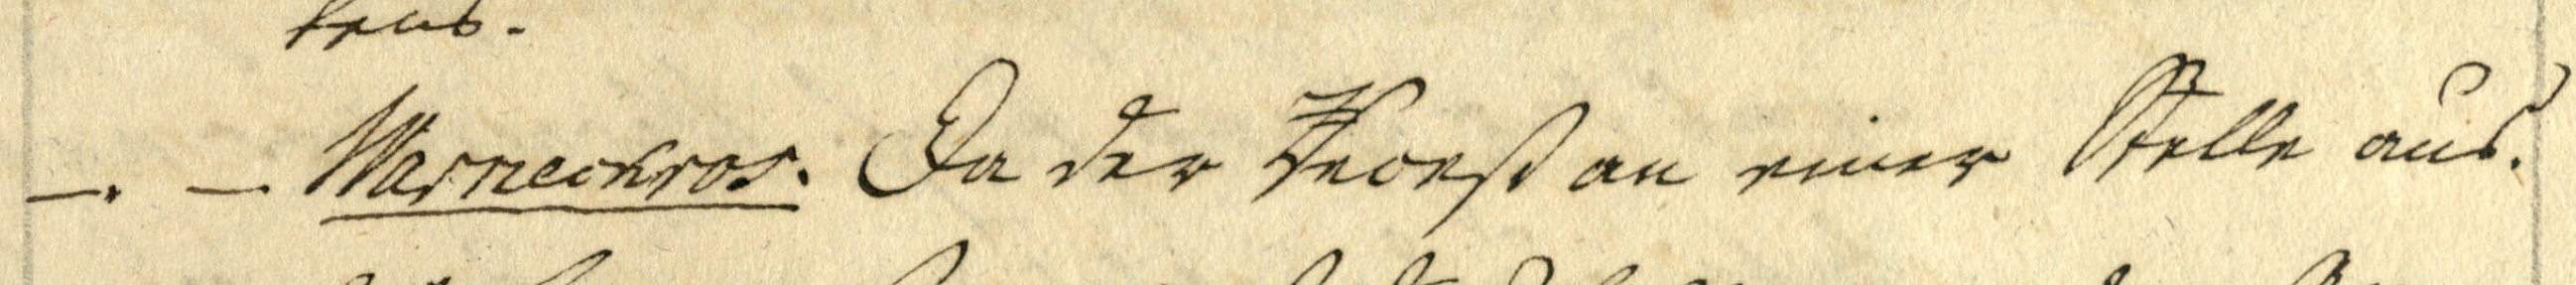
Warneckros. Da der Receß an einer Stelle aus¬
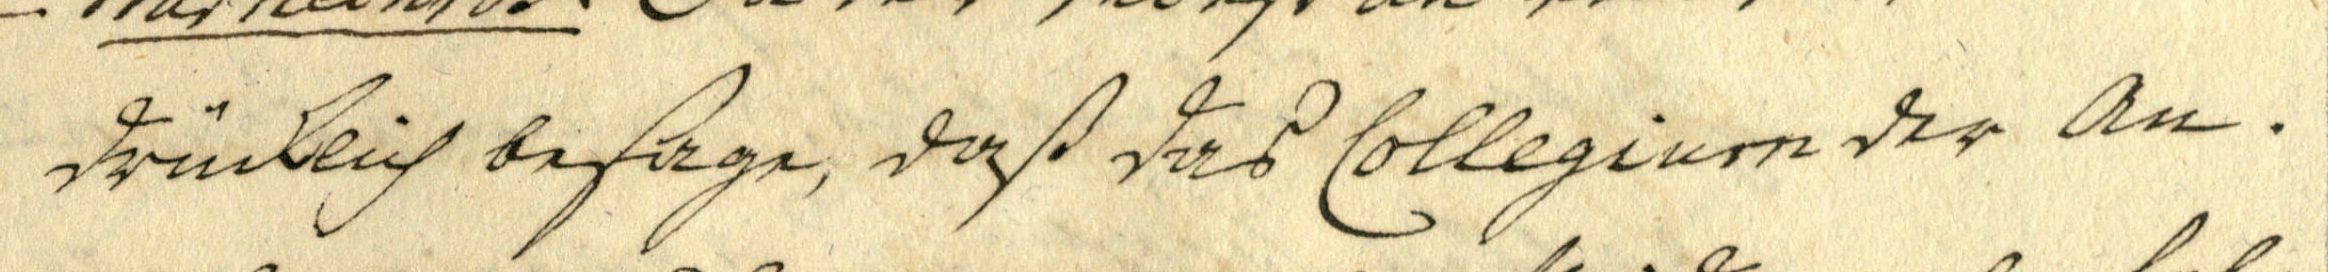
drücklich besage, daß das Collegium der An¬
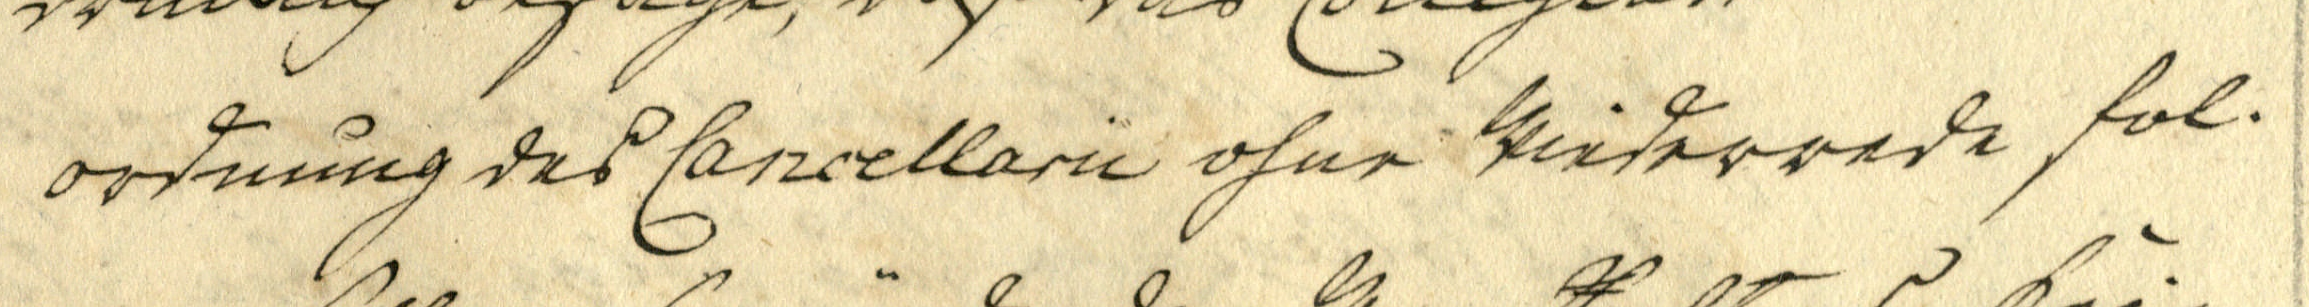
ordnung des Cancellarii ohne Wiederrede fol¬
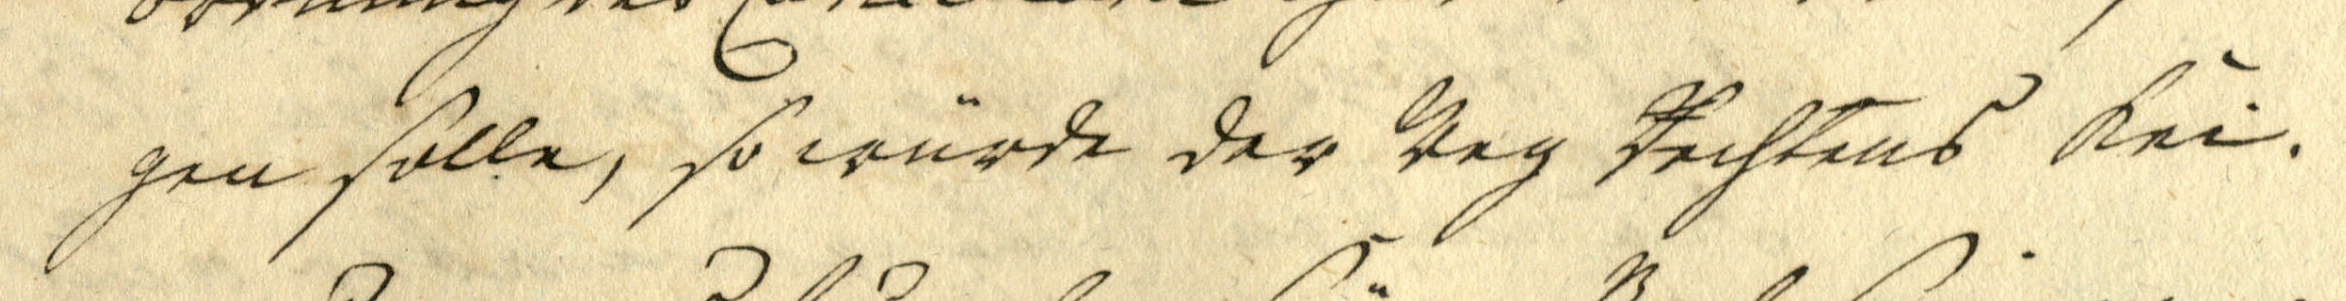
gen solle, so würde der Weg Rechtens kei¬
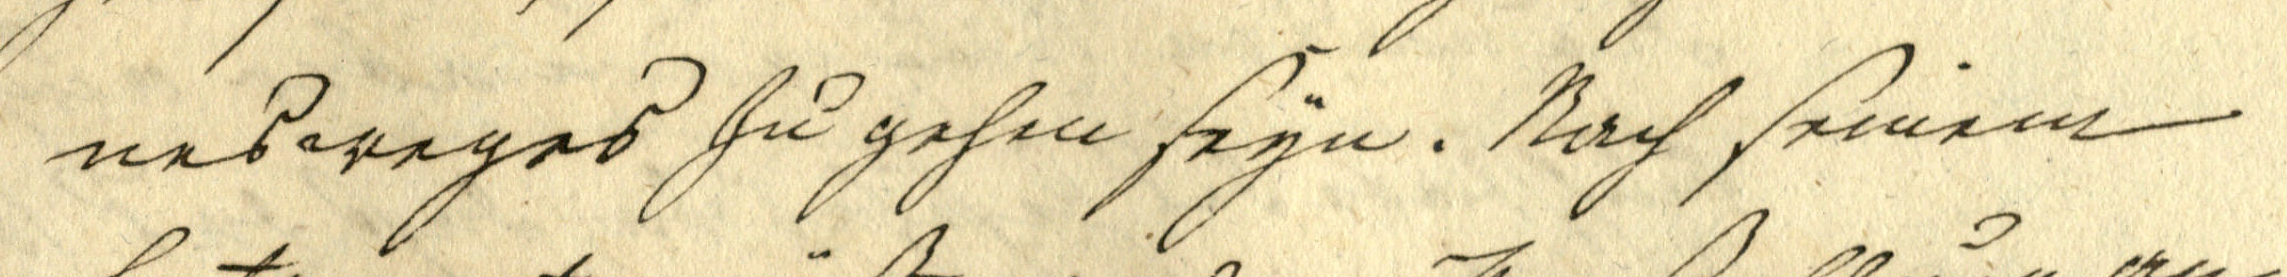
nesweges zu gehen seÿn. Nach seinem
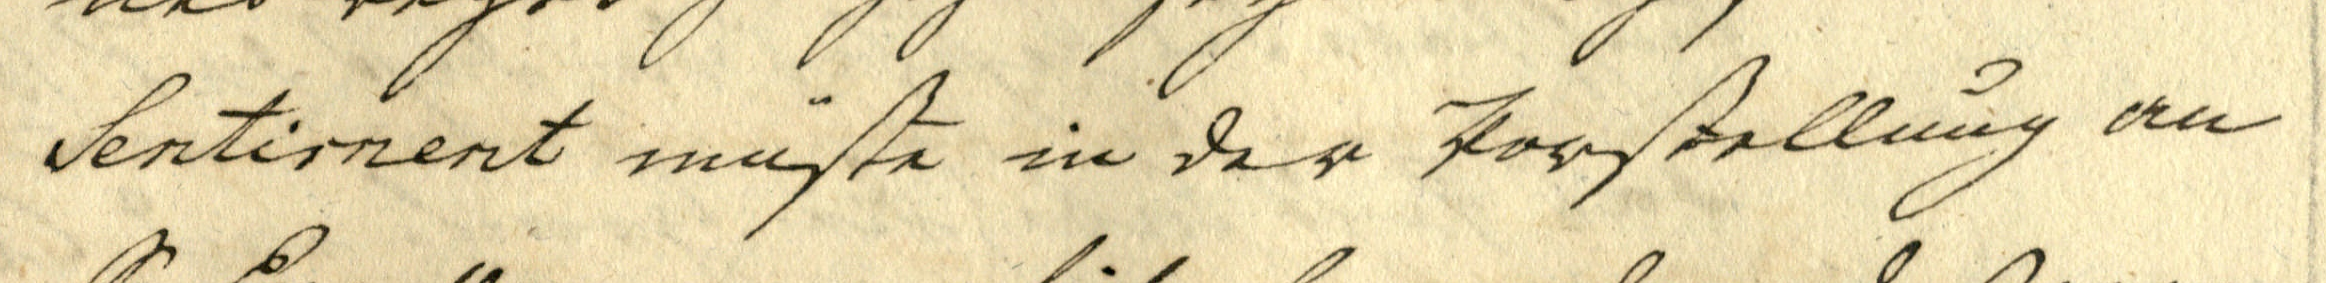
Sentiment müßte in der Vorstellung an
